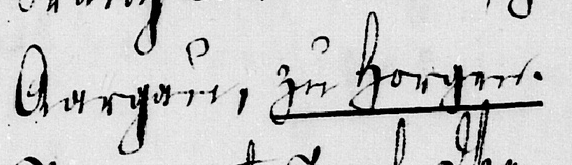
Aargau, zu Horgen.
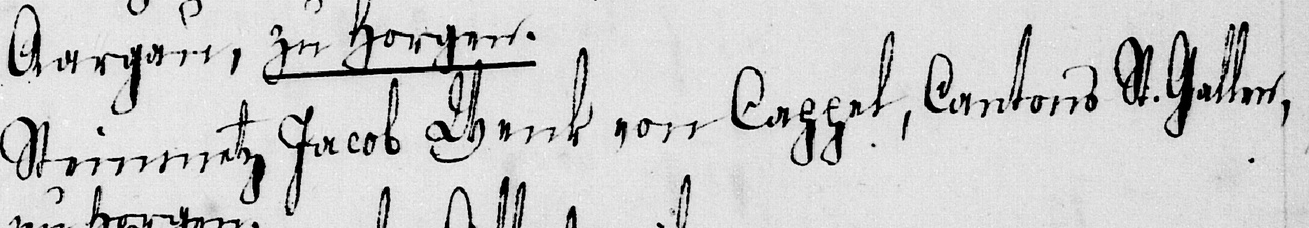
teinmetz Jacob Wenk von Cappel, Cantons St. Gallen,
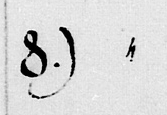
8.)
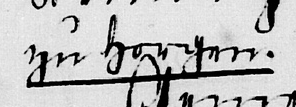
zu Horgen.
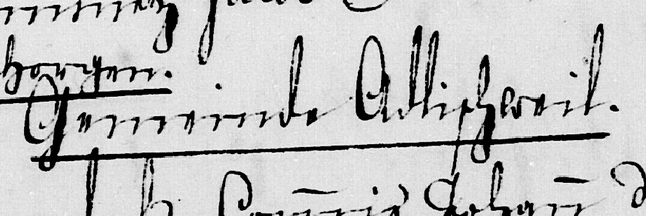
Gemeinde Adlischweil.
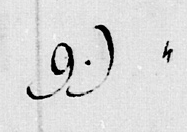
9.)
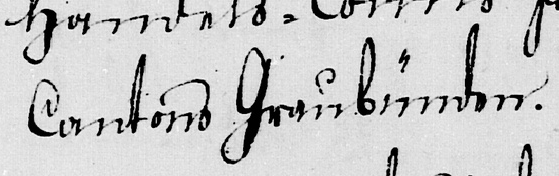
Cantons Graubünden.
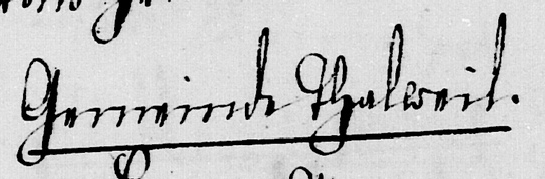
Gemeinde Thalweil.
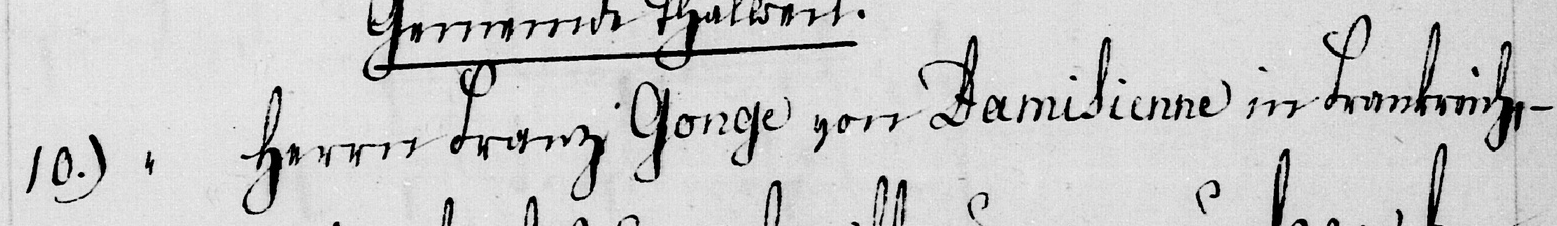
10.) „ Herrn Franz Gonge von Damilienne in Frankreich,
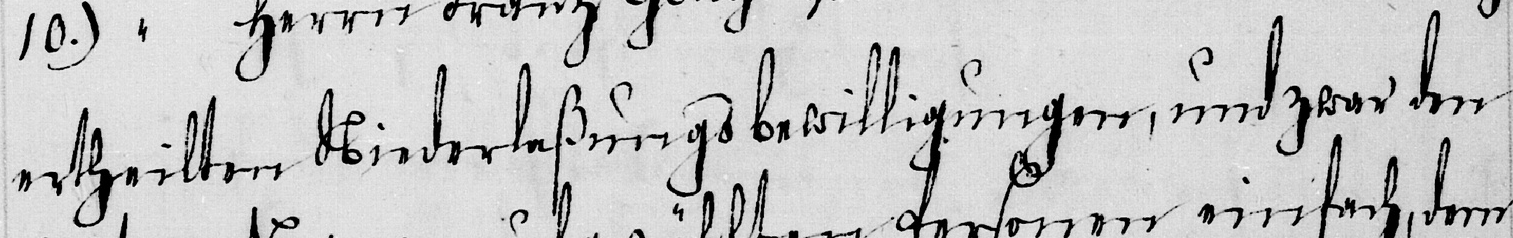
ertheilten Niederlaßungsbewilligungen, und zwar den
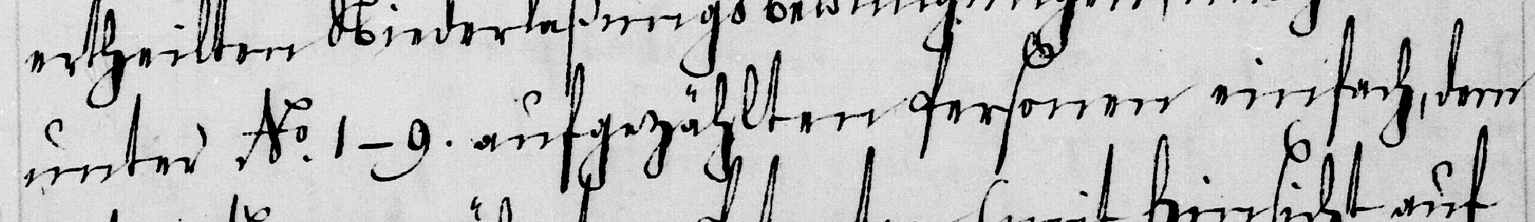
unter No. 1–9. aufgezählten Personen einfach, dem
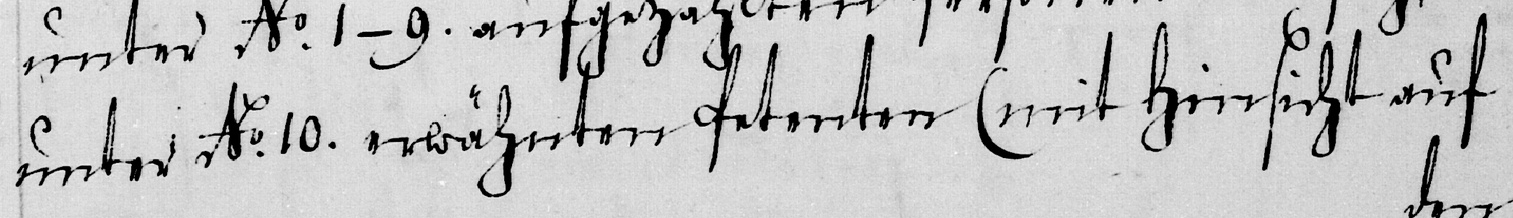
unter No. 10. erwähnten Petenten (mit Hinsicht auf
